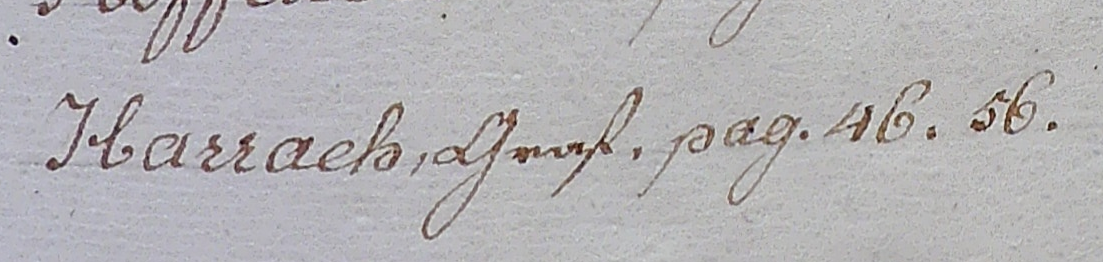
Harrach, Graf, pag. 46. 56.
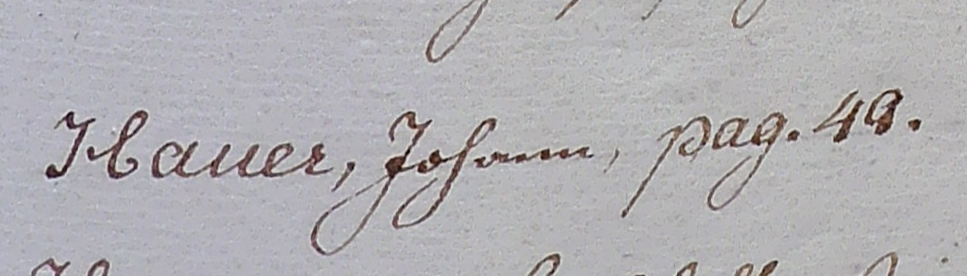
Hauer, Johann, pag. 49.
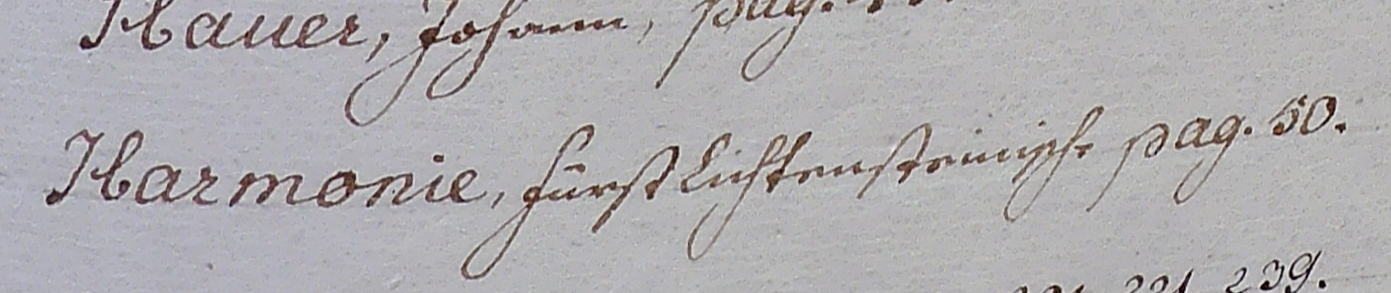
Harmonie, Fürst Lichtensteinische pag. 50.
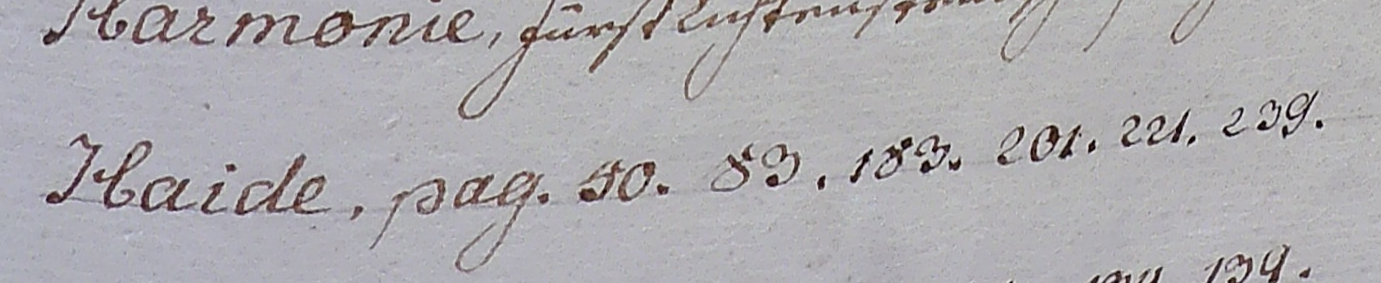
Haide, pag. 50. 83. 183. 201. 221. 239.
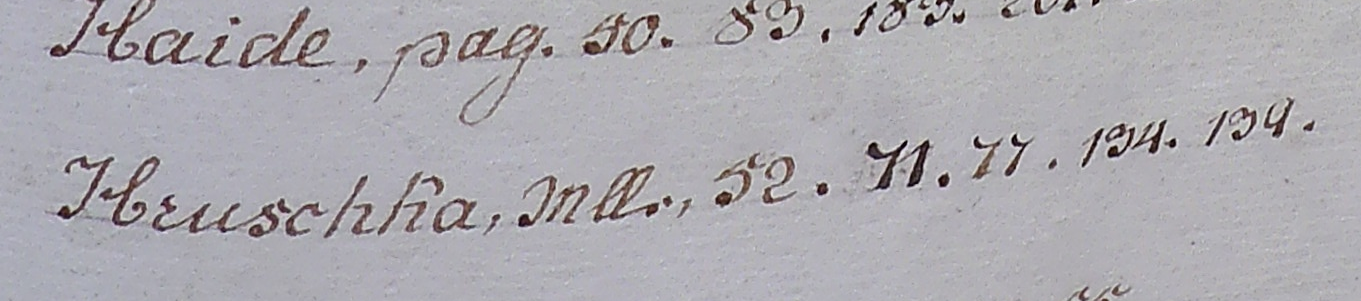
Hruschka, Mlle, 52. 71. 77. 134. 139.
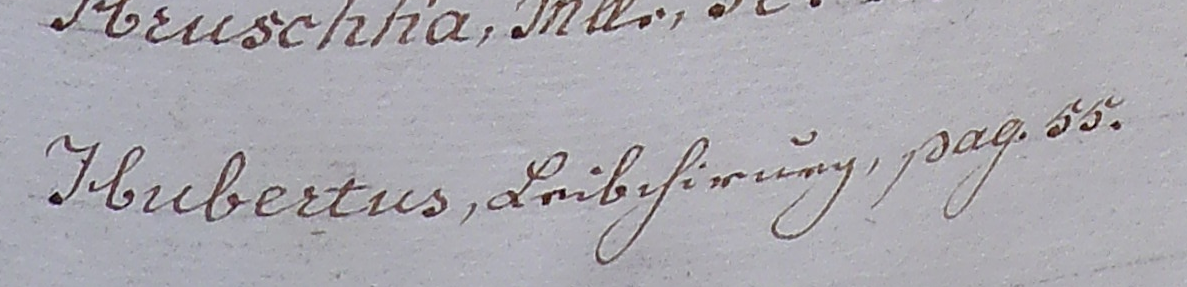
Hubertus, Leibchirurg, pag. 55.
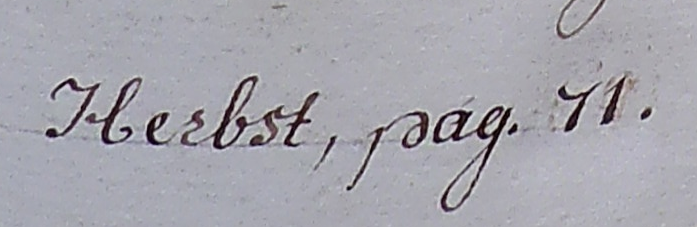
Herbst, pag. 71.
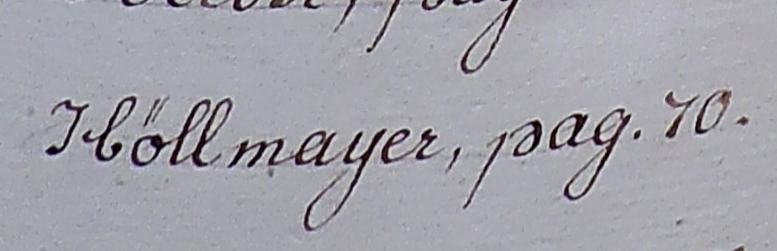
Höllmayer, pag. 70.
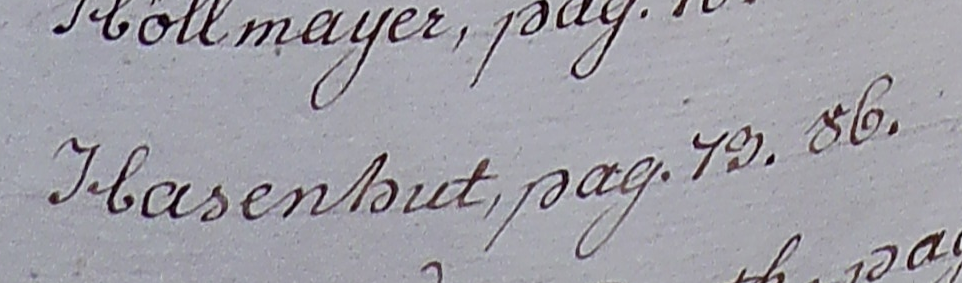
Hasenhut, pag. 73. 86.
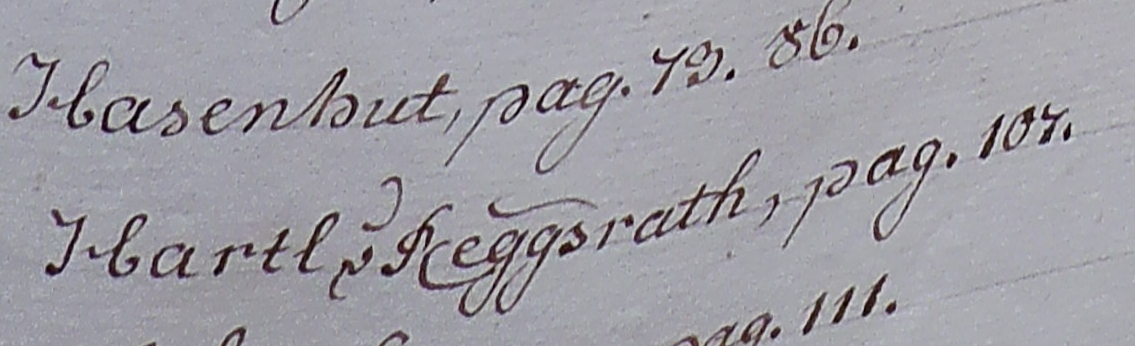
Hartl v Reg͞gsrath, pag. 107.
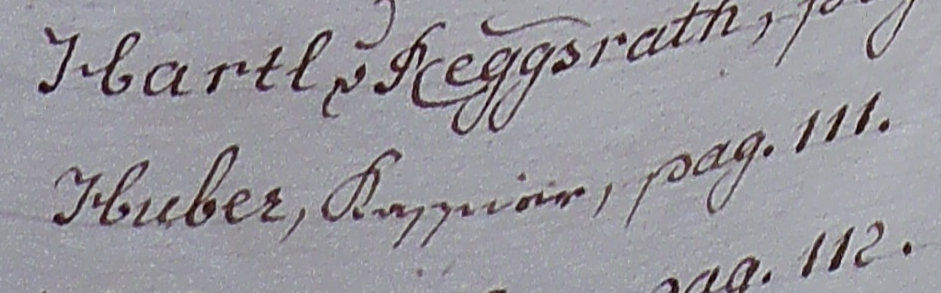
Huber, Kassier, pag. 111.
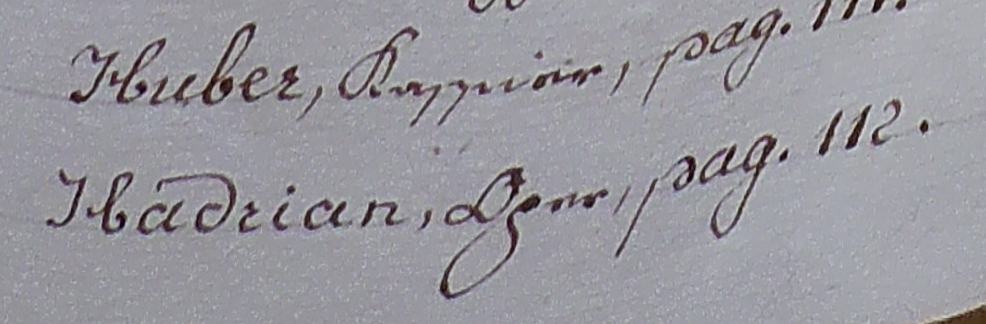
Hadrian, Oper, pag. 112.
